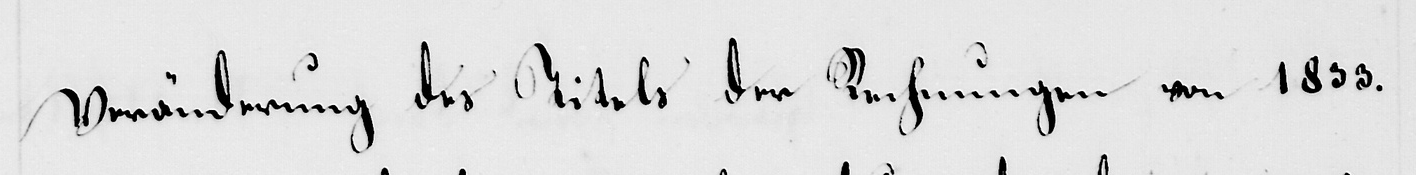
Veränderung des Titels der Rechnungen von 1833.
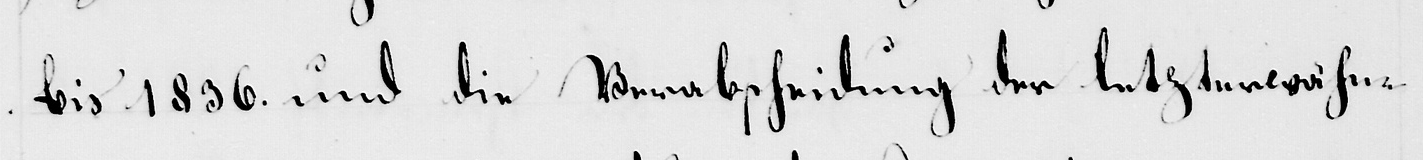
bis 1836. und die Verabscheidung der letzterwähn¬
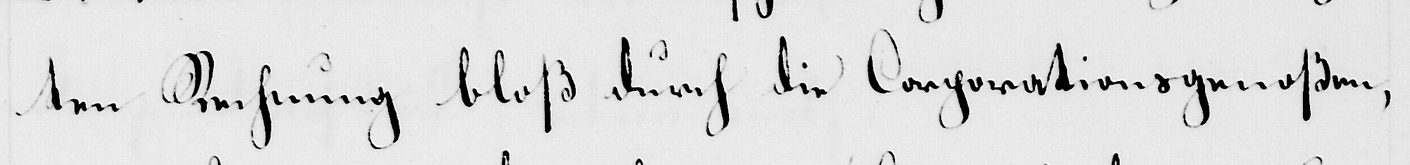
ten Rechnung bloß durch die Corporationsgenoßen,
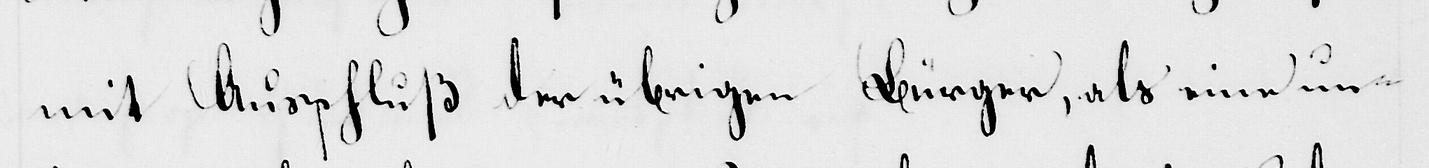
mit Ausschluß der übrigen Bürger, als eine un¬
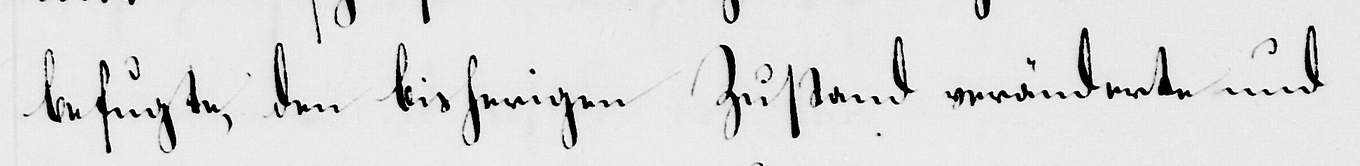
befugte, den bisherigen Zustand veränderte und
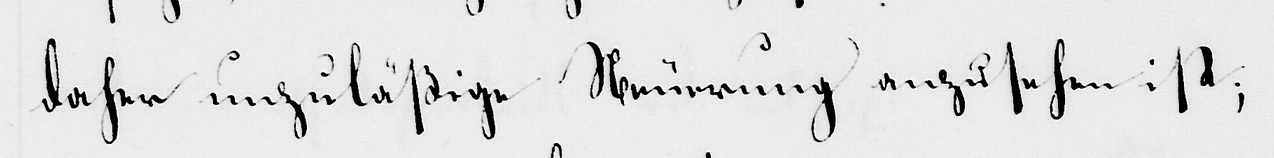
daher unzuläßige Neuerung anzusehen ist;
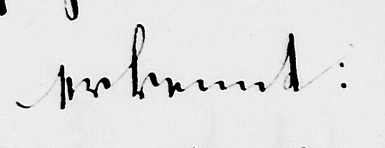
erkannt:
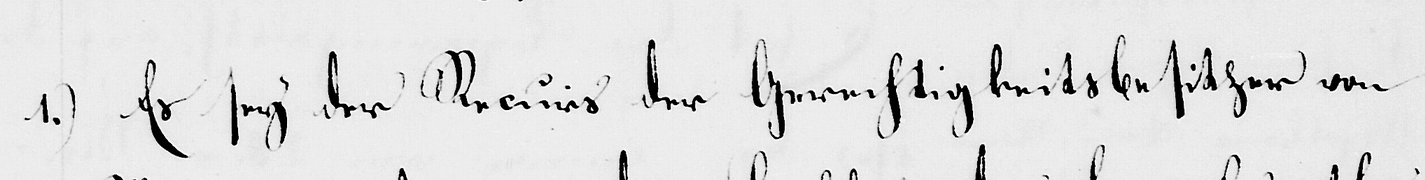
1.) Es sey der Recurs der Gerechtigkeitsbesitzer von
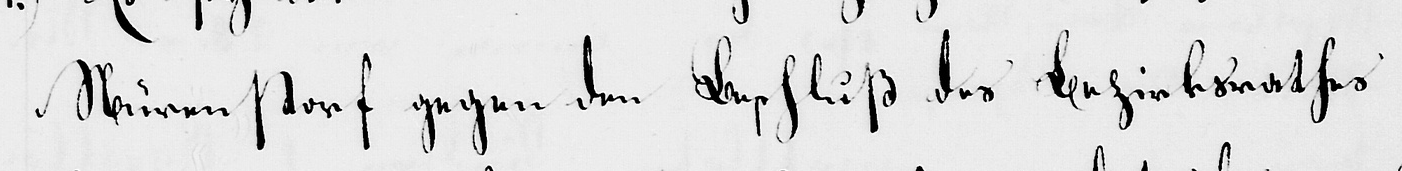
Nürenstorf gegen den Beschluß des Bezirksrathes
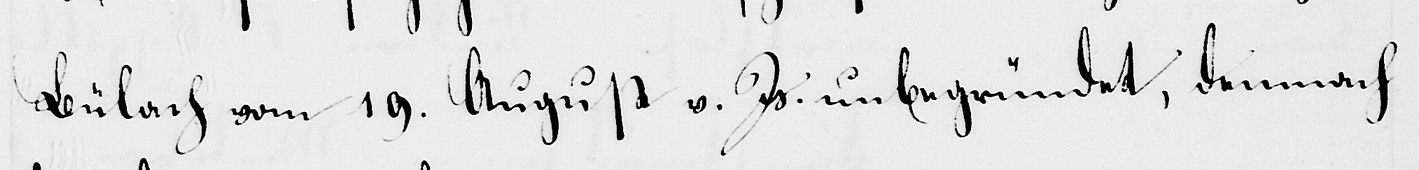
Bülach vom 19. August v. Js. unbegründet, demnach
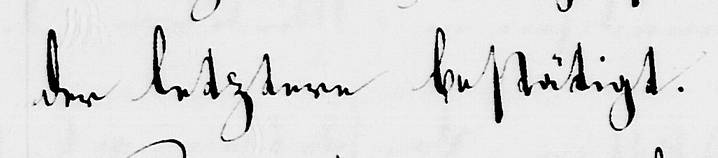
der letztere bestätigt.
